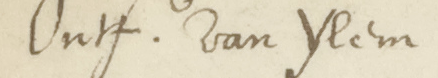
Ontfer van Ylem
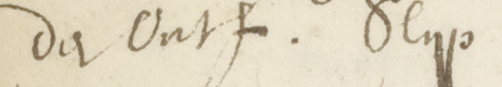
den ontfer. Slyp
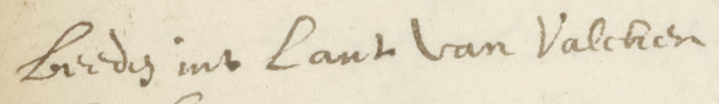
beeden int lant van Valcken
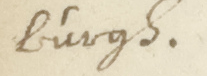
burgh.
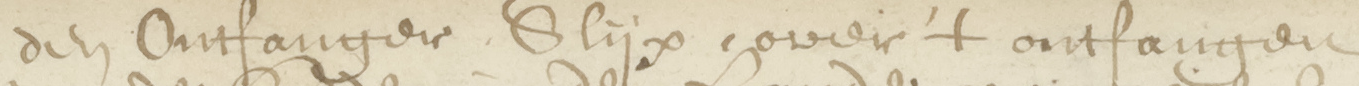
den Ontfanger Slijp, over 't ontfangen
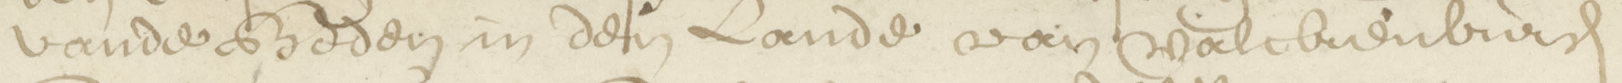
vande Beden in den Lande van Valckenburch
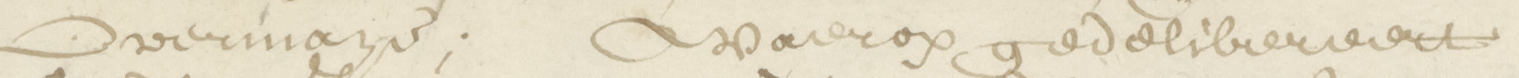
Overmaze; Waerop gedelibereert
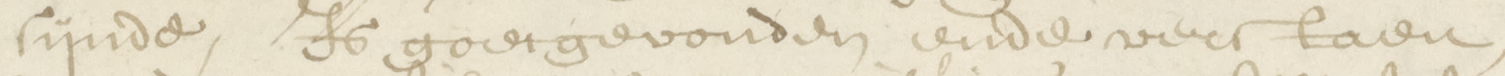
sijnde, Is goetgevonden ende verstaen
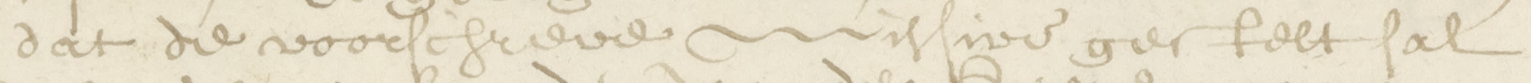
dat de voorschreven missive gestelt sal
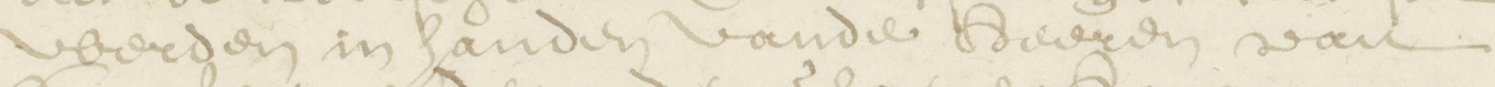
werden in handen vande Heeren van
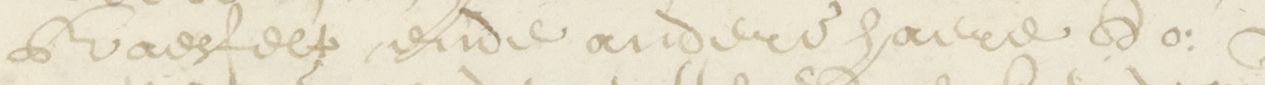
Raesfelt, ende andere haere Ho:Mo:
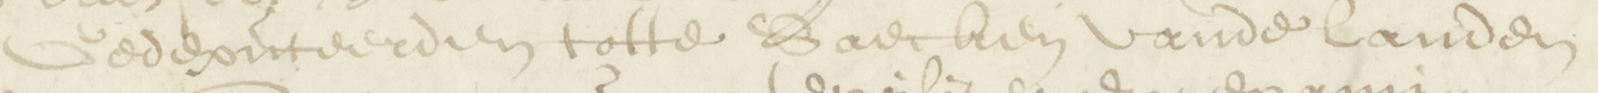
Gedeputeerden totte Saecken vande Landen
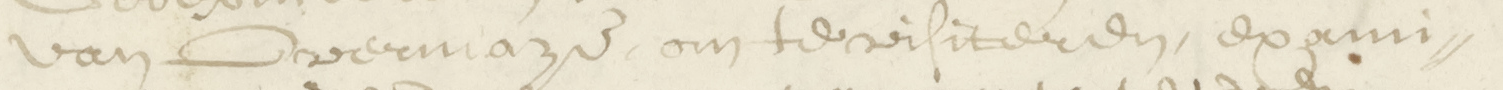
van Overmaze om te visiteren, exami„
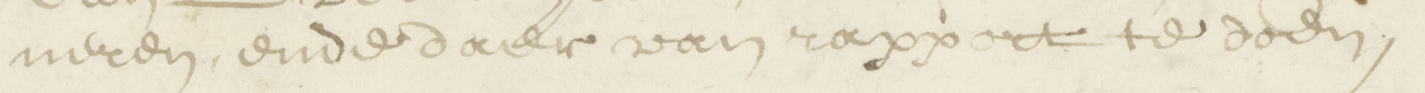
neren, ende daer van rapport te doen.
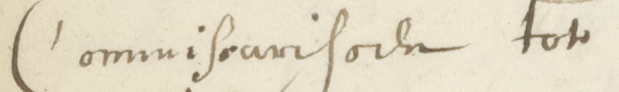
Commissarissen tot
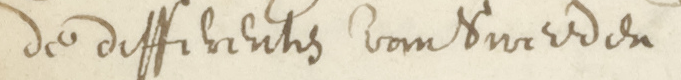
de differenten van Sweeden
